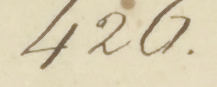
426.
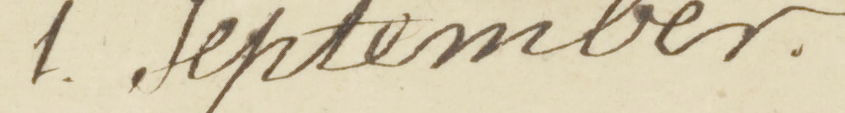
1. September.
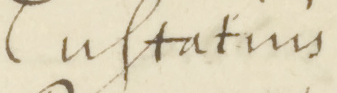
Eustatius
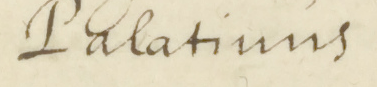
Palatinus
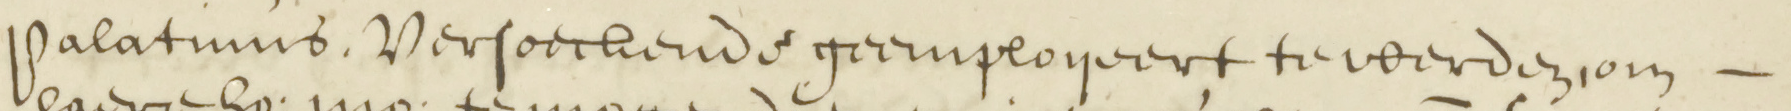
Palatinus, Versoeckende geemployeert te werden, om —
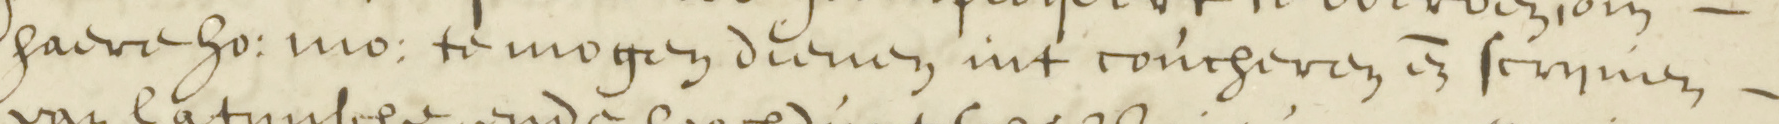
haere ho:mo: te mogen dienen int coucheren en scryuen -
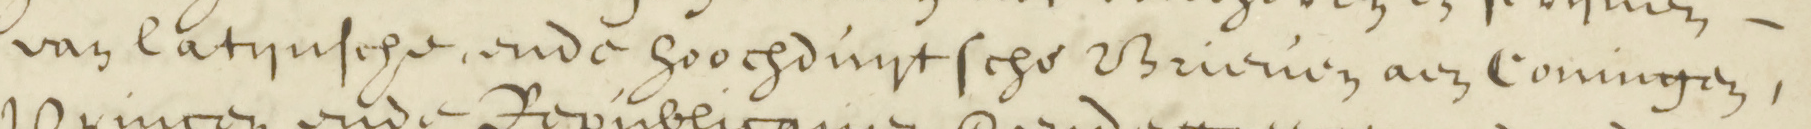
van latynsche, ende hoochduytsche Brieuen aen Coningen,
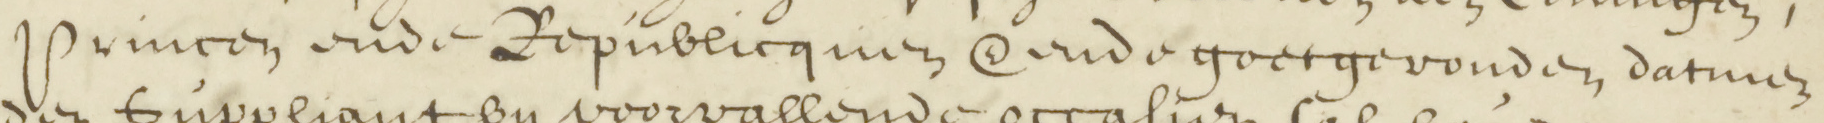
Princen ende Republicquen @ ende goetgevonden datmen
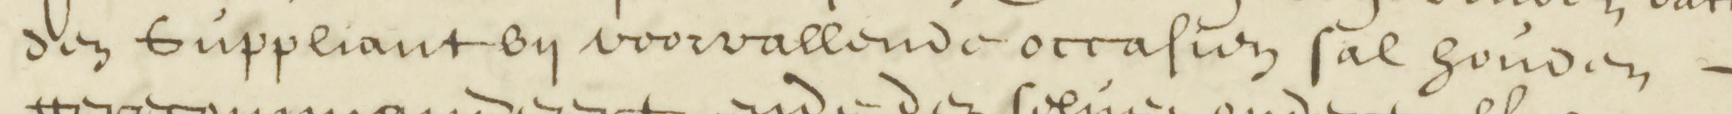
den Suppliant bij voorvallende occasien sal houden -
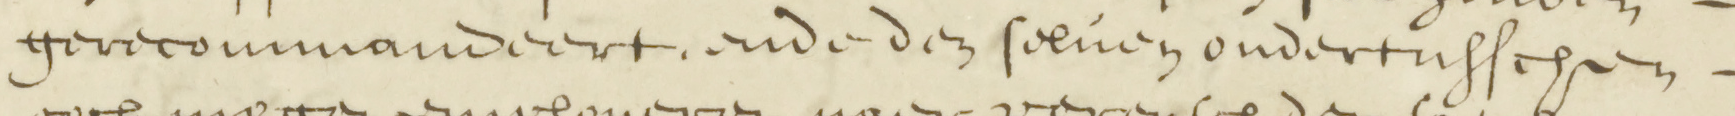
gerecommandeert, ende den seluen ondertusschen -
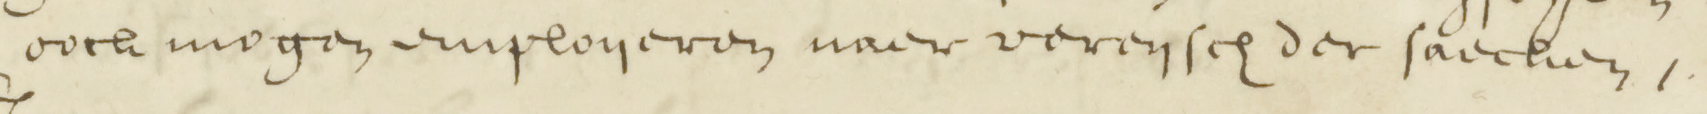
oock mogen employeren naer vereysch der saecken.
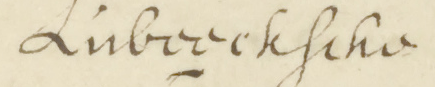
Lubeecksche
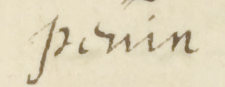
penin
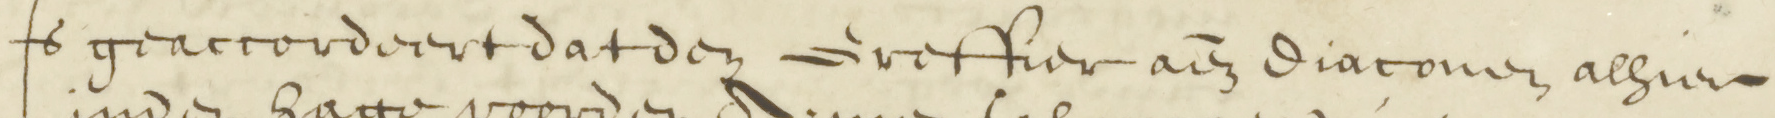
Is geaccordeert dat den Greffier aen Diaconen alhier
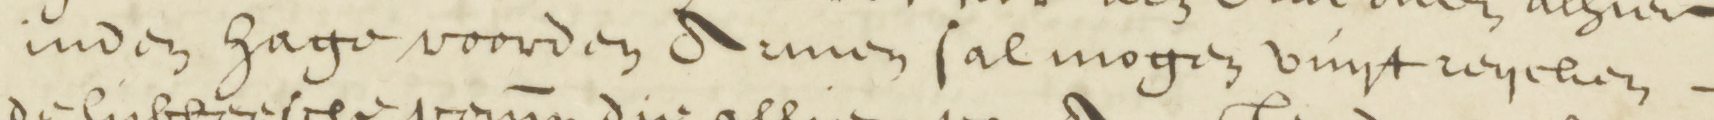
inden hage voorden Armen sal mogen vuytreycken -
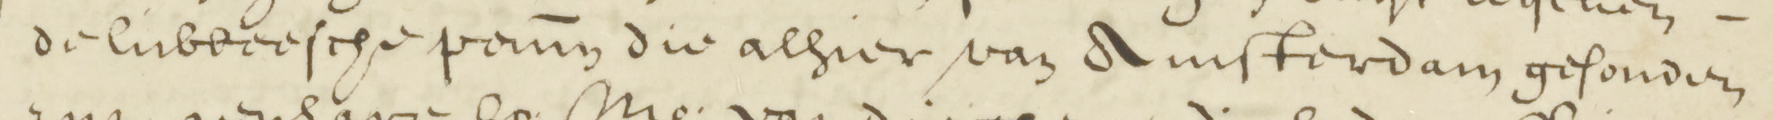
de lubbeesche penin die alhier van Amsterdam gesonden
